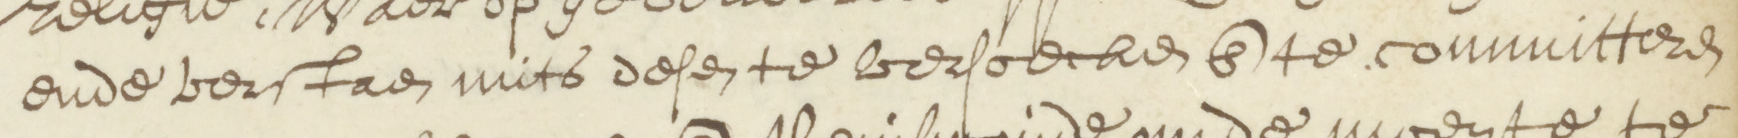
ende verstaen mits desen te versoecken & te committeren
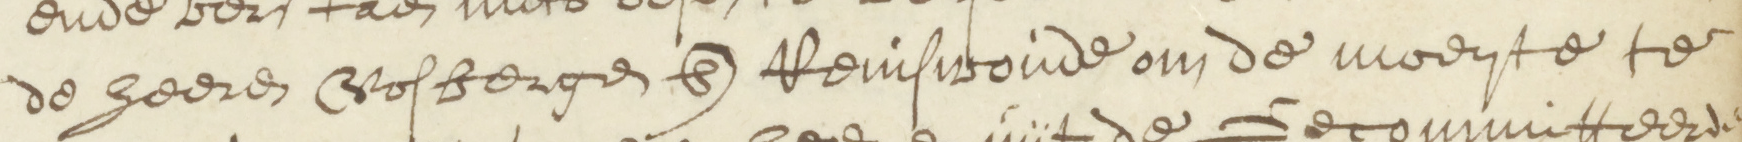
de heeren Vosbergen & Reinswoude om de moeyte te
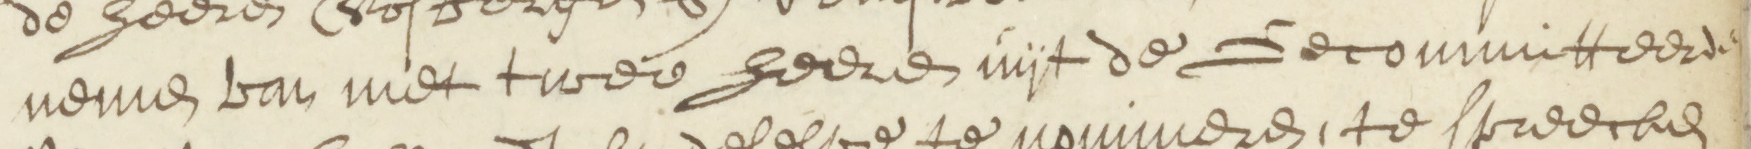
nemen van met twee heeren uijt de Gecommitteerde
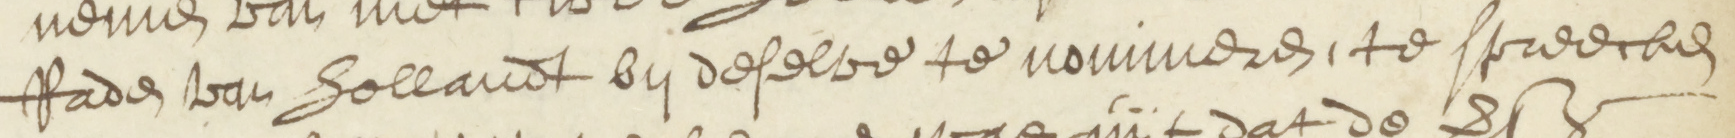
Raden van Hollandt by deselve te nomineren, te spreecken
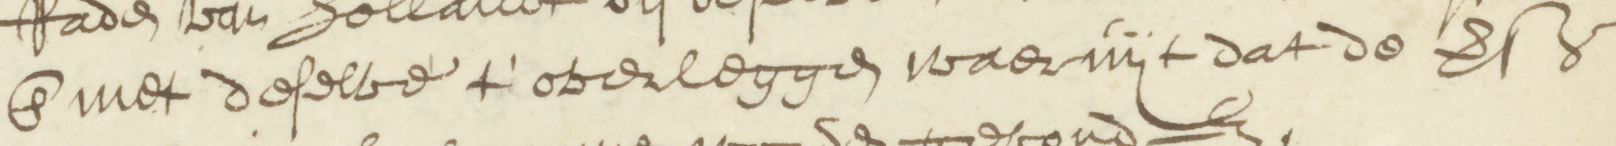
& met deselve t‛overleggen waeruijt dat de vs
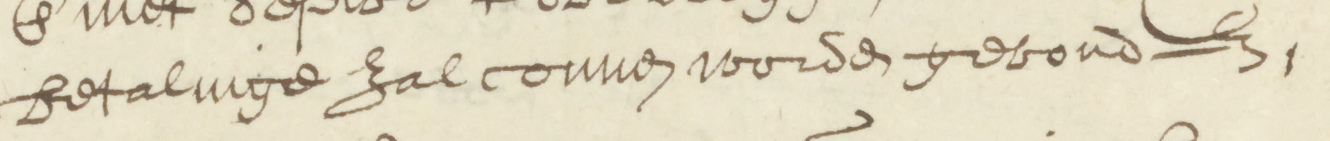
betalinge zal connen worden gevonden.
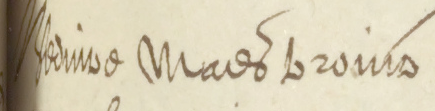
Weduwe Maes vrouw
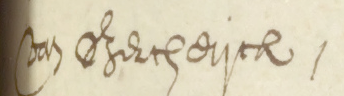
van Bercheijck.
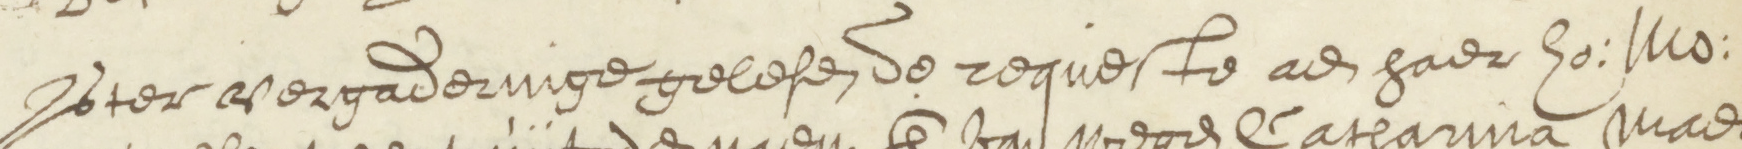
Is ter vergaderinge gelesen de requeste aen haer ho:Mo:
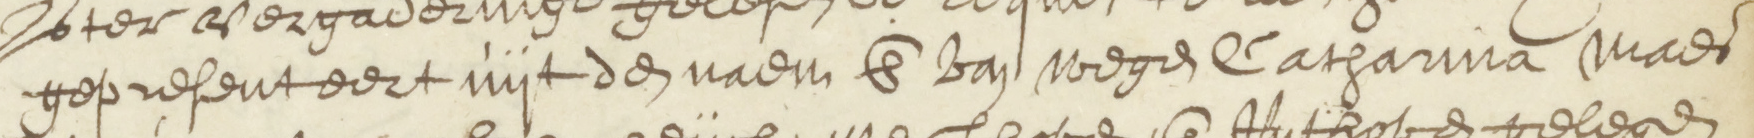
gepresenteert uijt den naem & van wegen Catharina maes
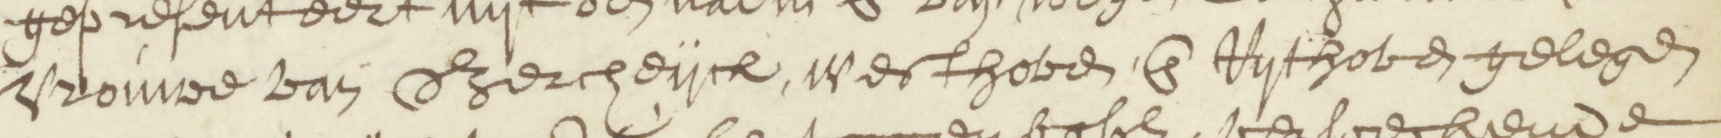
Vrouwe van Bercheijck, Westhoven, & Rijthoven gelegen
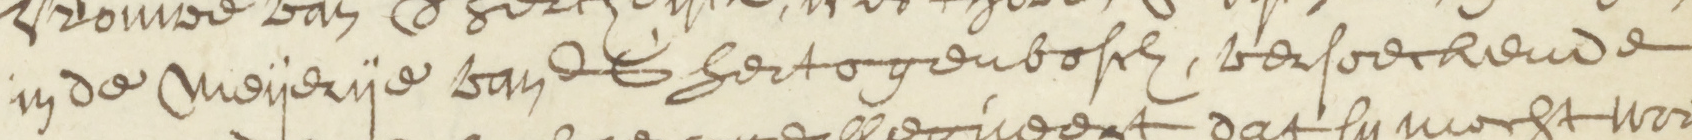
in de meijerije van S‛hertogenbosch, versoeckende
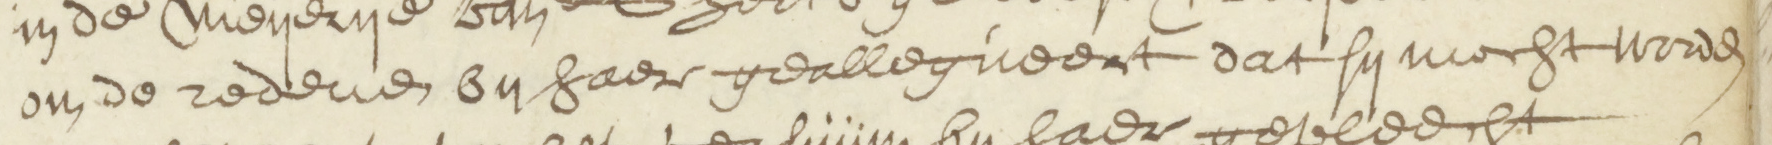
om de redenen by haer geallegueert dat sy mocht worden
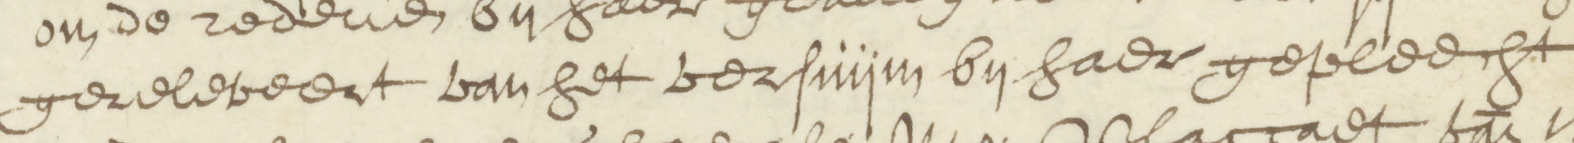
gereleveert van het versuijm by haer gepleecht
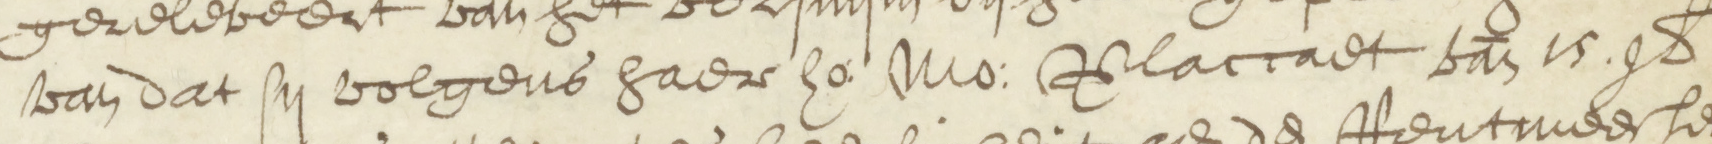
van dat sy volgens haer ho:Mo: Placcaet van 15. 9b
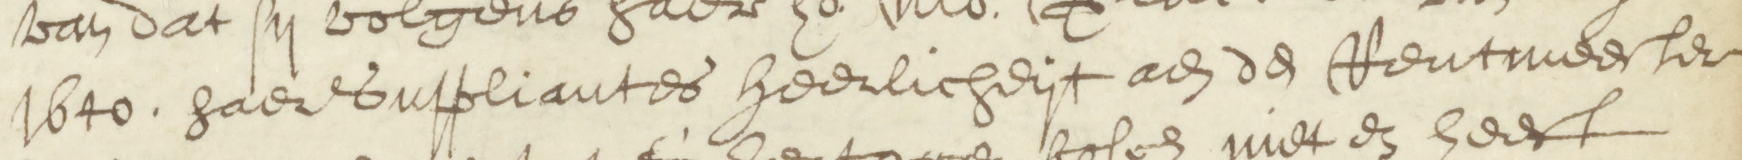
1640. haer Suppliantes heerlicheijt aen den Rentmeester
